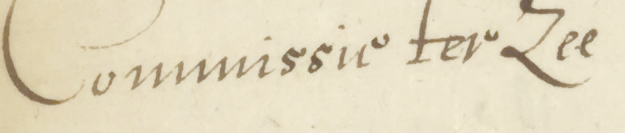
Commissie ter Zee
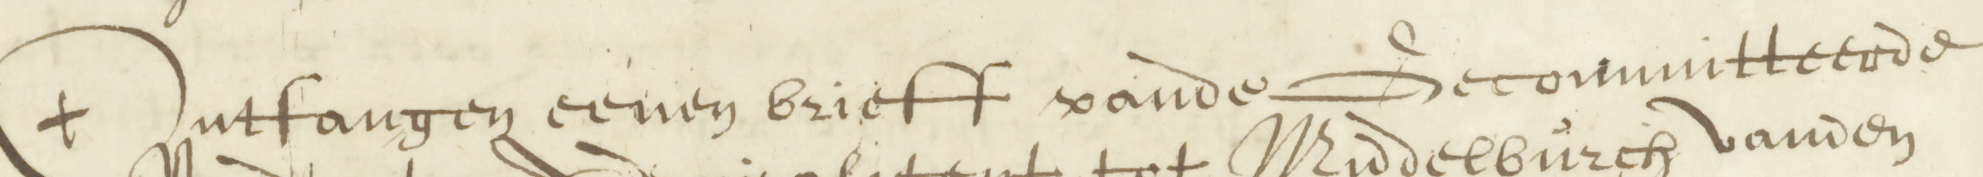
Ontfangen eenen brieff vande Gecommitteerde
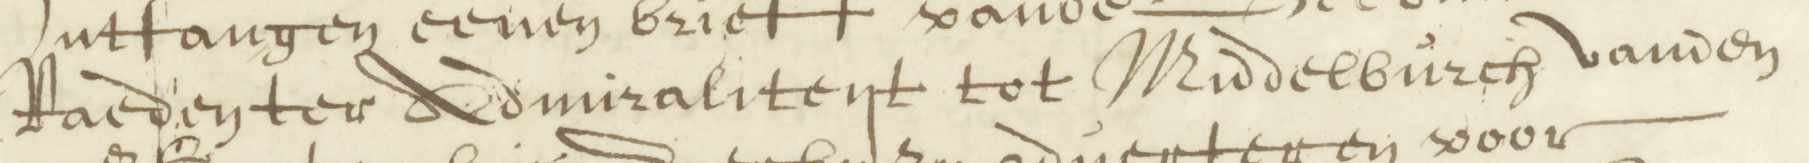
Raeden ter Admiraliteyt tot Middelburch vanden
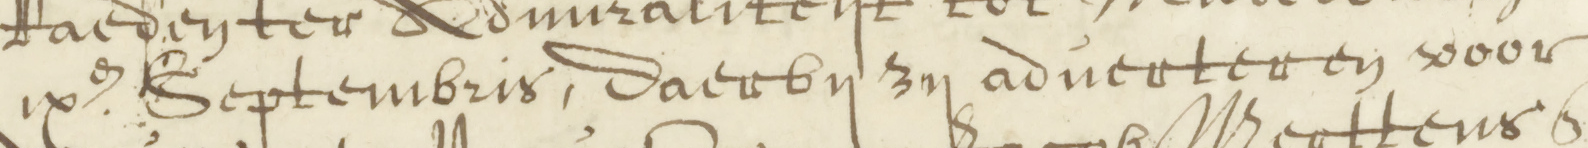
ixen. Septembris, daerby zy aduerteren voor
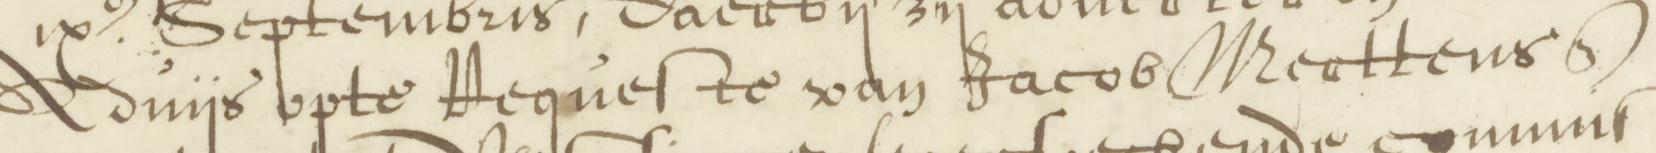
Aduijs opte Requeste van Jacob Merttenss
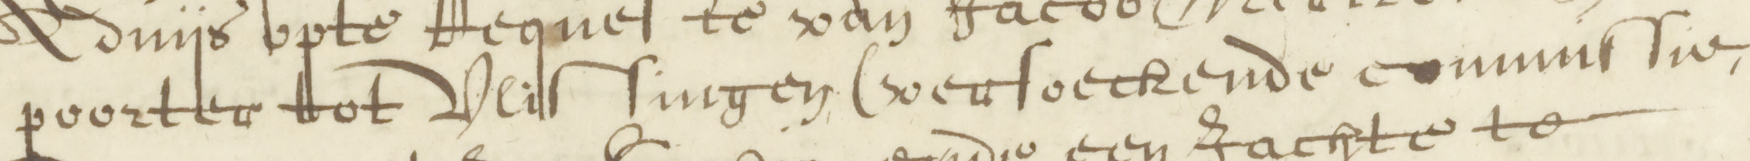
poorter tot Vlissingen (versoeckende commissie
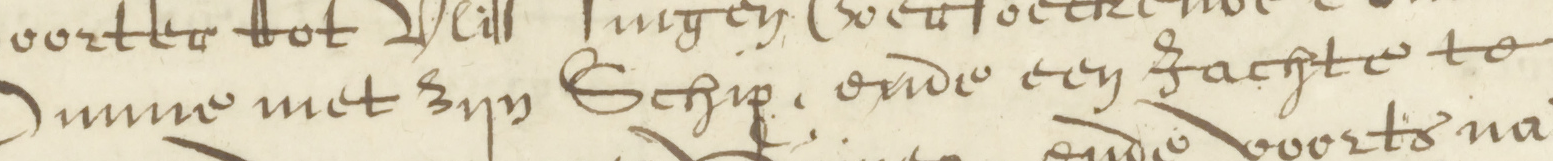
Omme met zyn Schip, ende een Jachte te
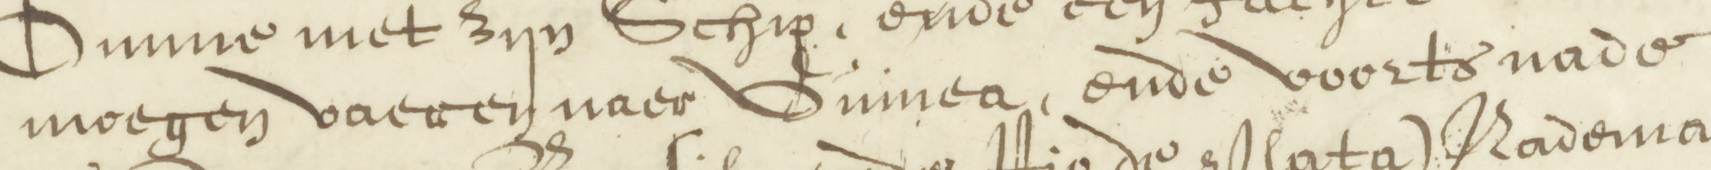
moegen vaeren naer Guinea, ende voorts nade
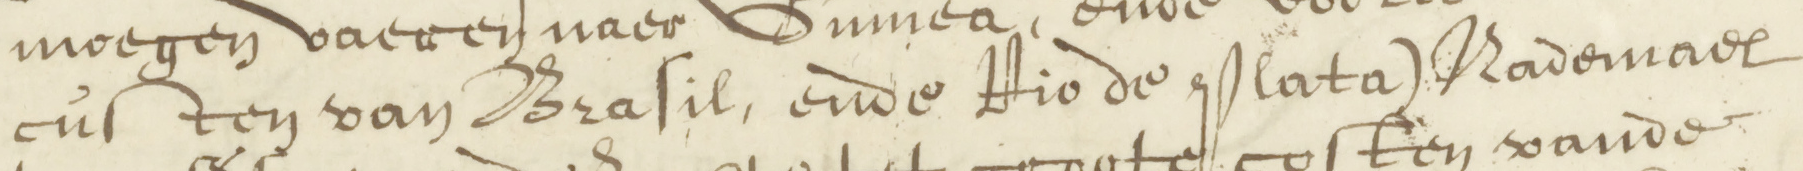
custen van Brasil, ende Rio de Plata) Nademael
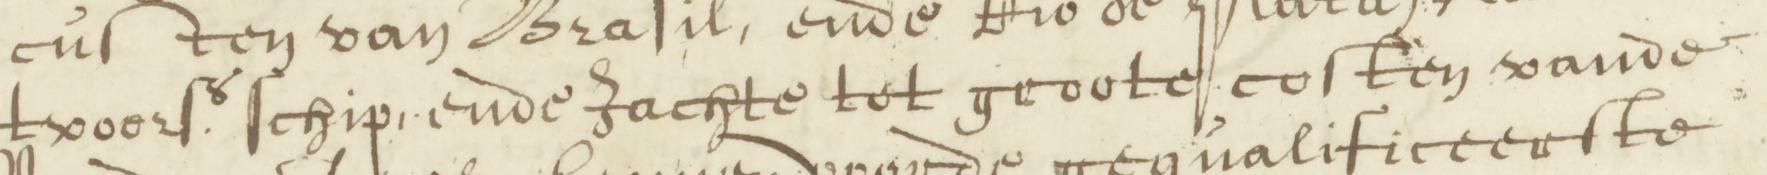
t voors. schip, ende Jachte tot groote costen vande
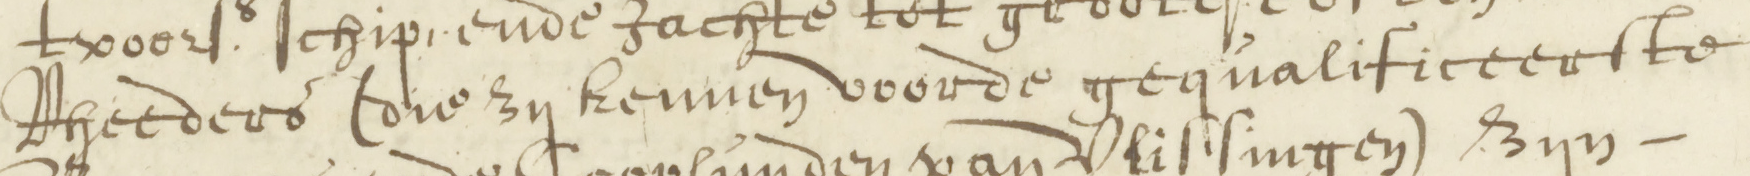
Rheeders (die zy kennen voorde gequalificeerste
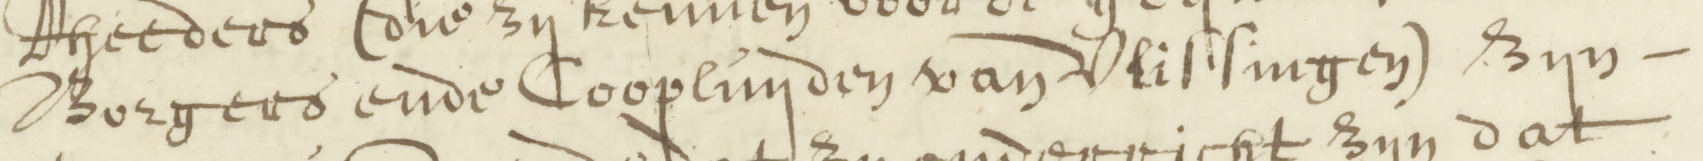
Borgers ende Coopluyden van Vlisisingen) zyn -
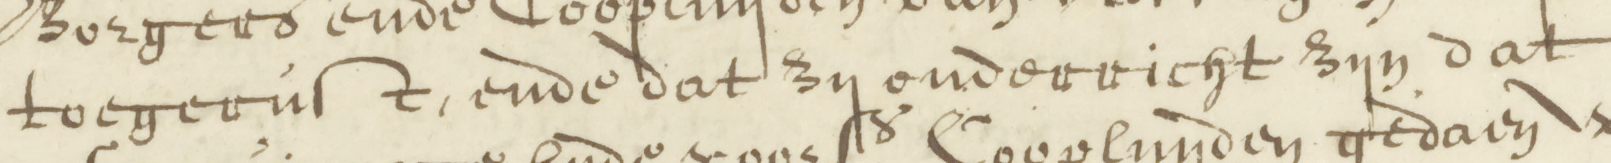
toegerust, ende dat zy onderricht zyn dat
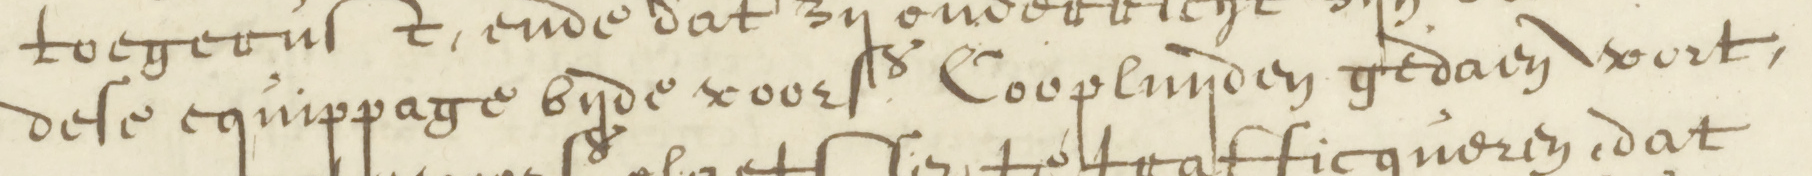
dese equippage byde voors. Coopluyden gedaen wort,
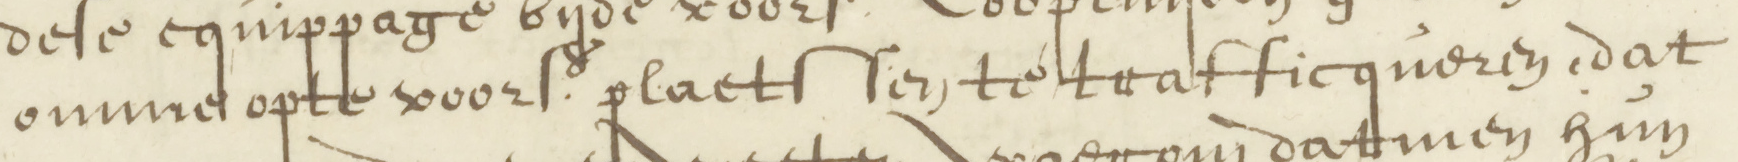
omme opte voors. plaetssen te trafficqueren, dat
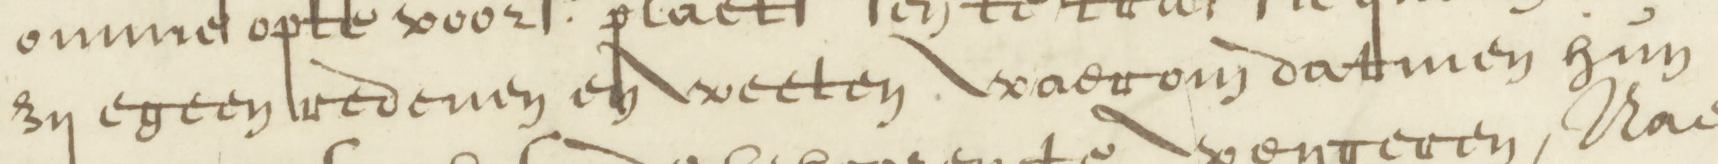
zy egeen redenen en weeten waerom datmen hun
